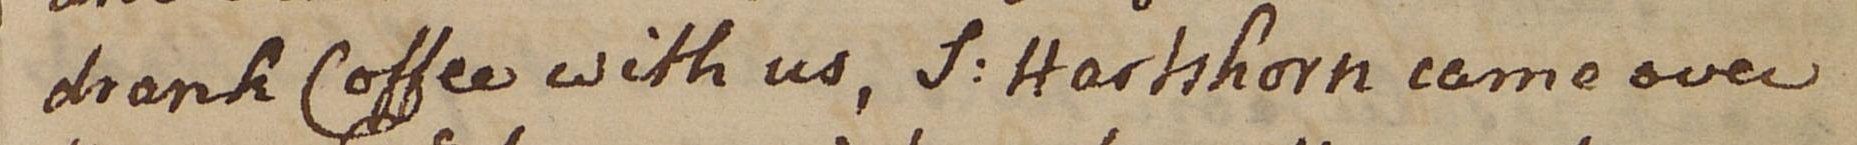drank Coffee with us, S: Hartshorn came ever
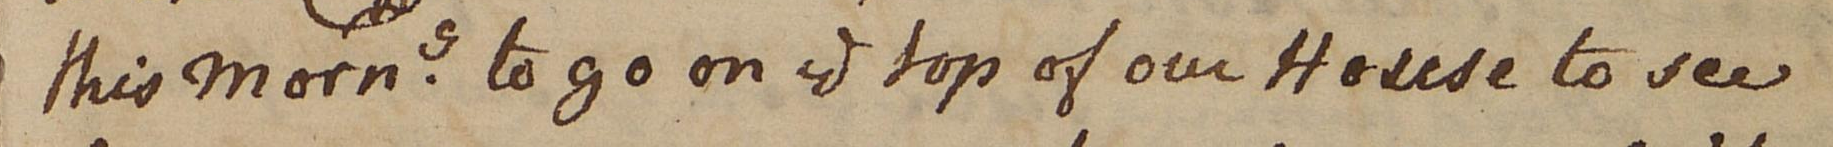this morn^g. to go on y^e top of our House to see
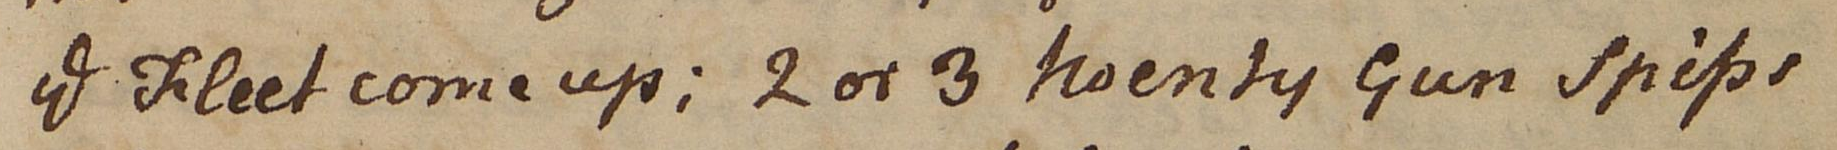y^e Fleet come up; 2 or 3 twenty Gun Ships
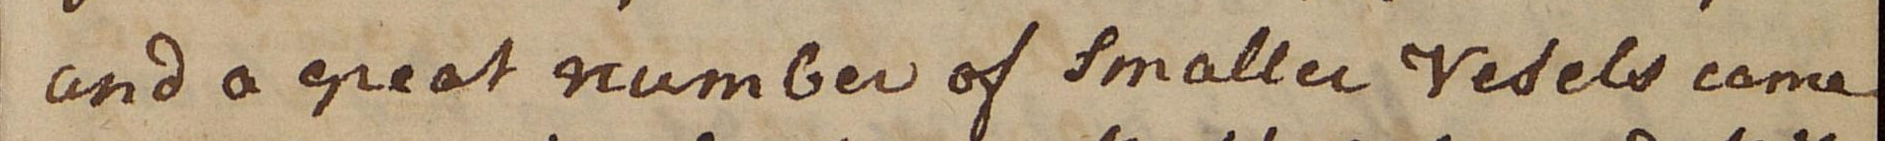and a great number of Smaller Vesels came
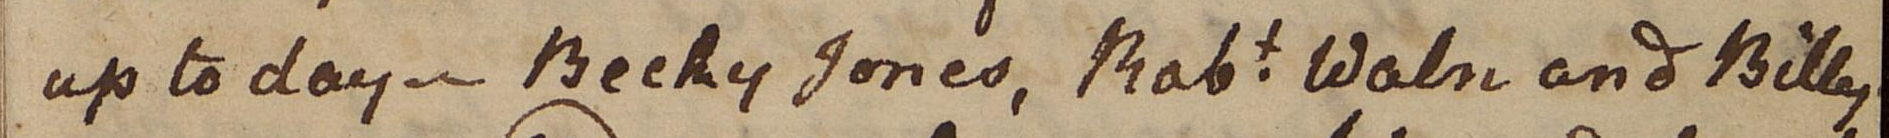up to day- Becky Jones, Rob^t. Waln and Bills
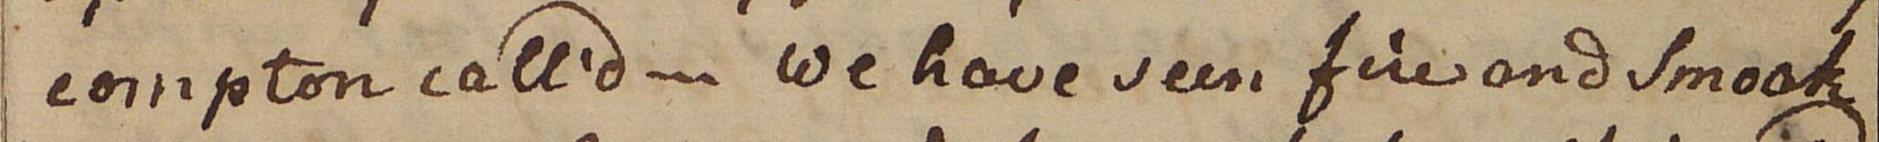compton call'd- we have seen fire and Smoak
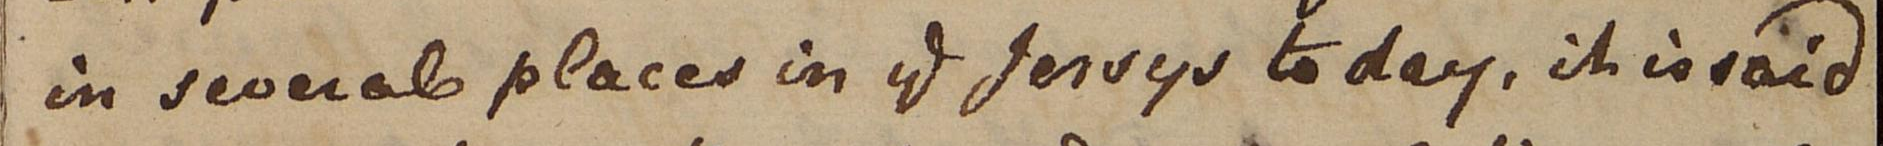in several places in y^e Jersys to day. it is said
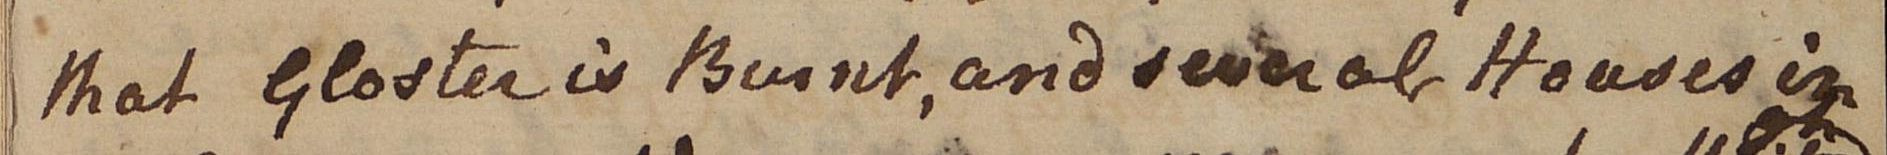that Gloster is Burnt, and several Houses in
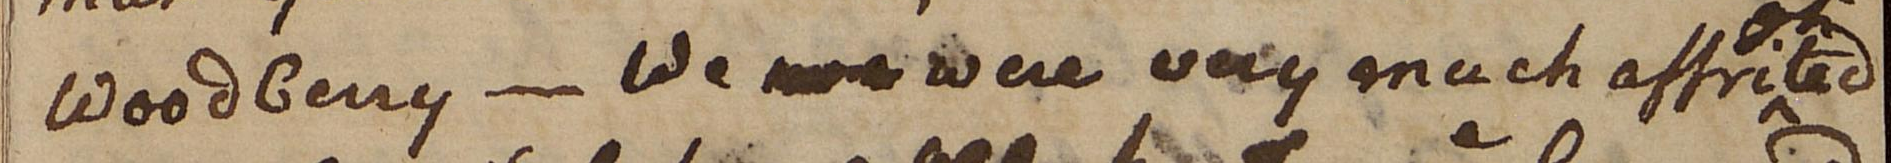Woodberry- We [are] were very much affri^ghted
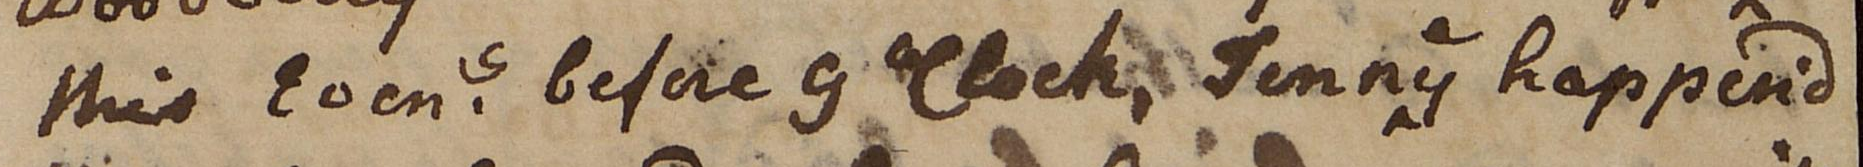this Even^g. before 9 oClock, Tenn^a y happen'd
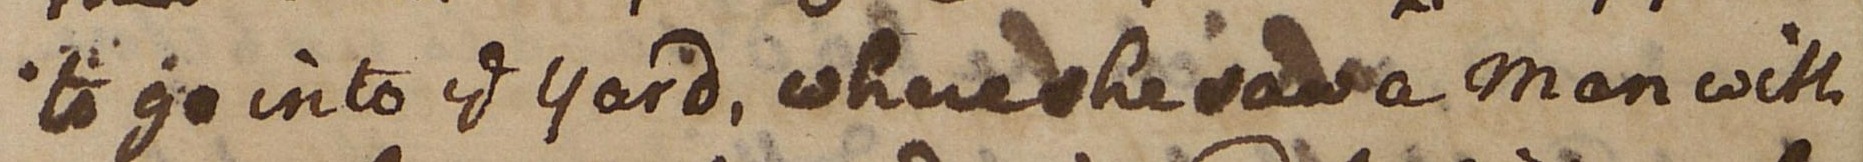to go into y^e yard, where she saw a man with
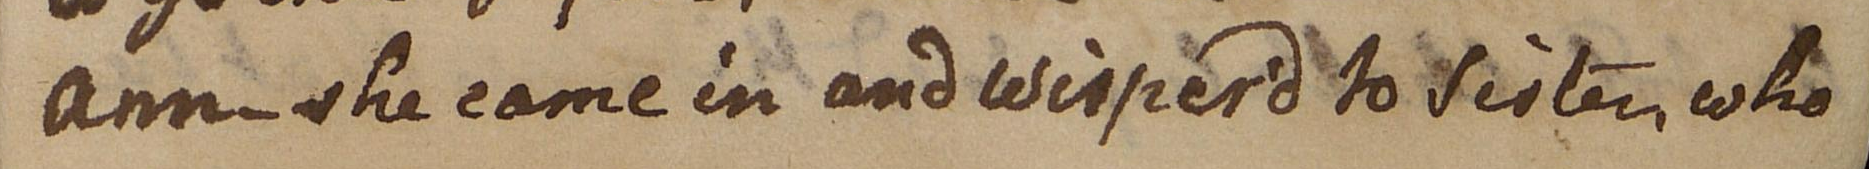Ann - she came in and wisper'd to Sister, who
